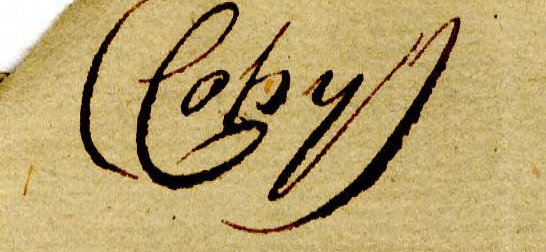(Copy)
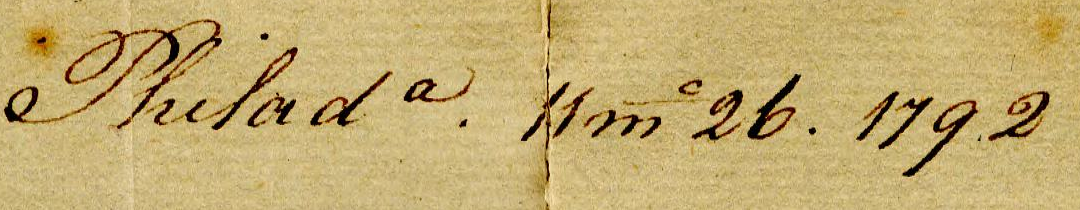Philad^a. 11 m^o 26. 1792
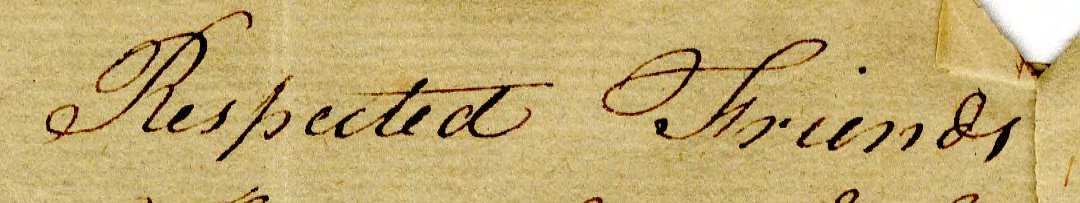Respected Friends
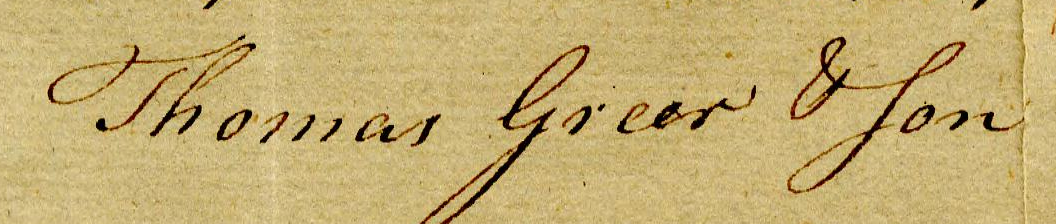Thomas Greer & Son
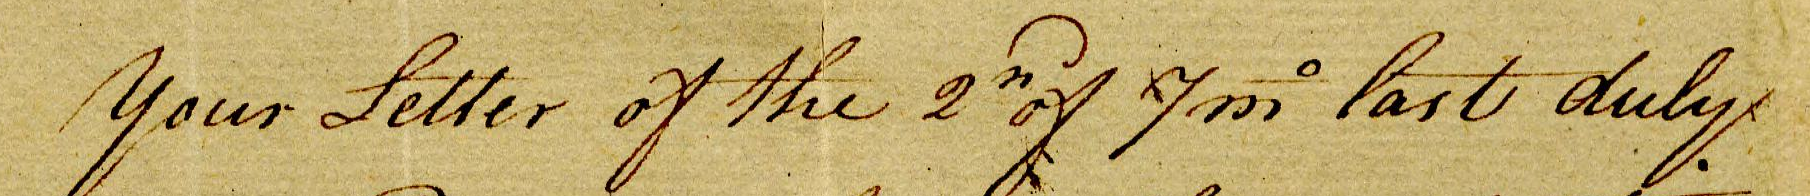your Letter of the 2^nd of 7 m^o last duly
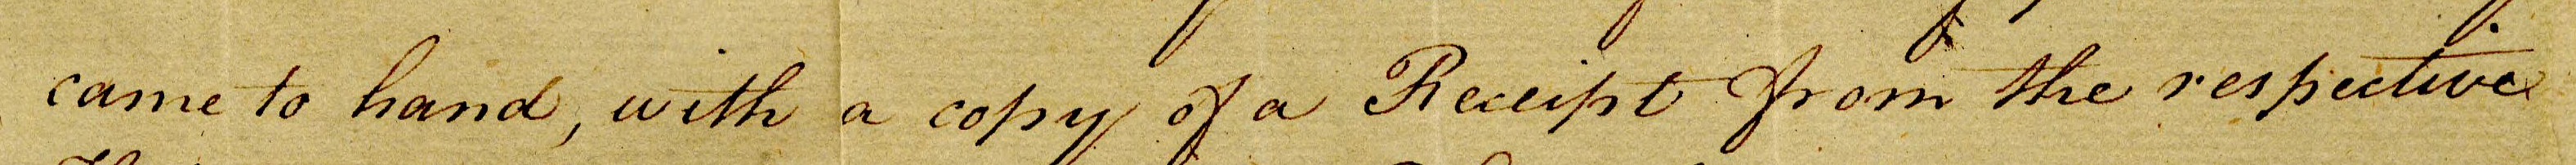came to hand, with a copy of a Receipt from the respective
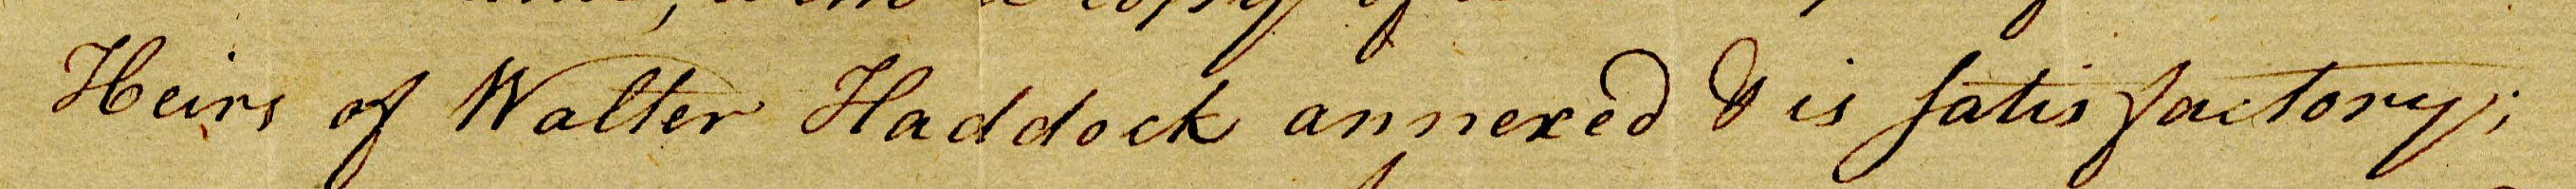Heirs of Walter Haddock annexed & is satisfactory;
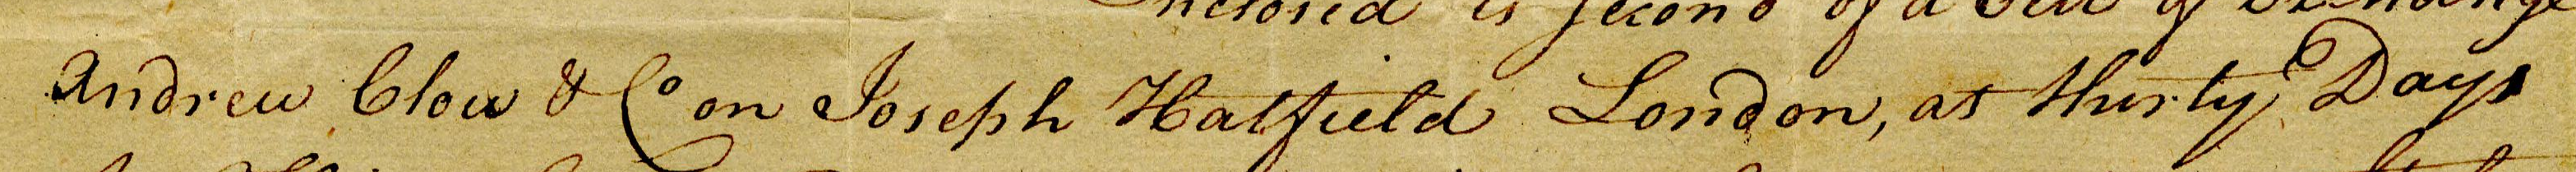Andrew Clow & C^o on Joseph Hatfield London, at thirty Days
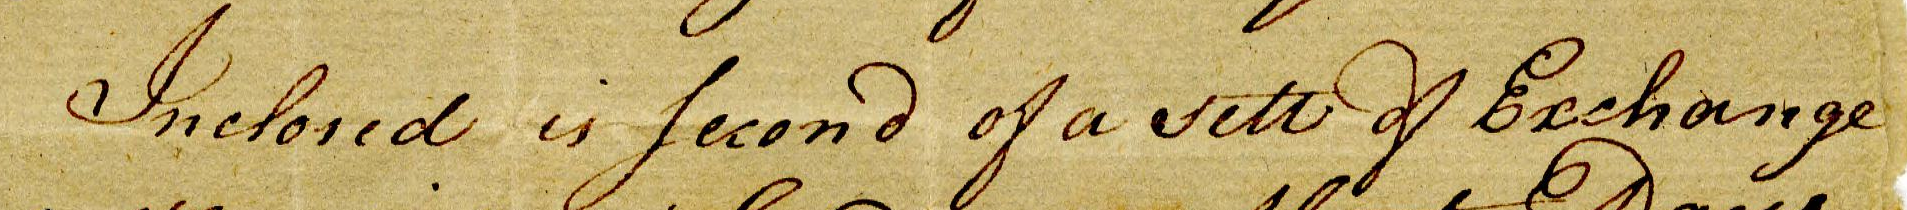Inclosed is second of a sett of Exchange
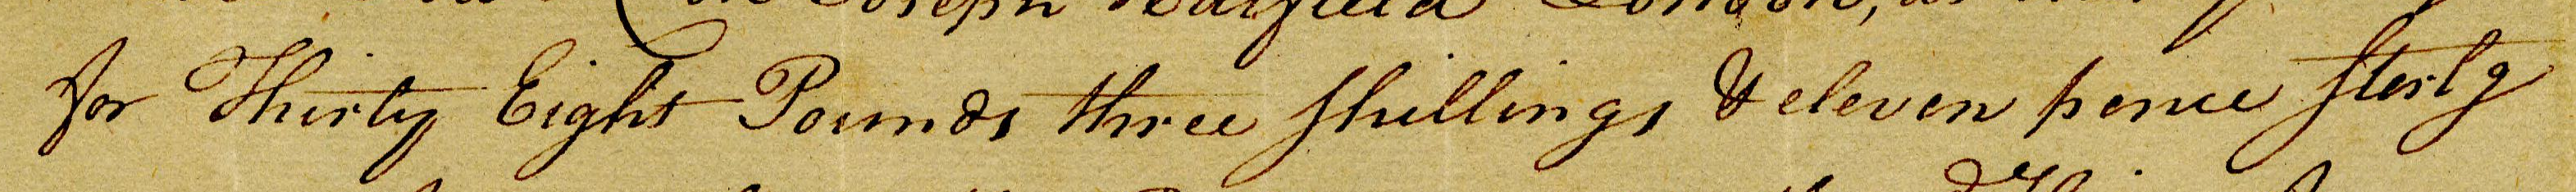for Thirty Eight Pounds three shillings & eleven pence Sterlg
